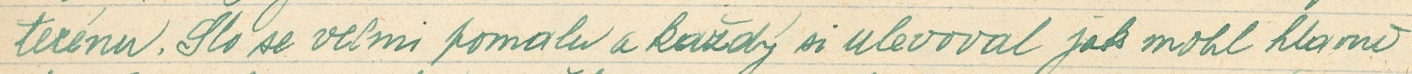terénu. Šlo se velmi pomalu a každý si ulevoval jak mohl hlavně
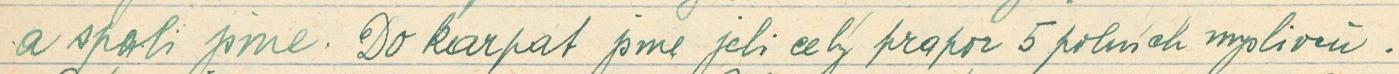a spali jsme. Do karpat jsme jeli celý prapor 5 polních myslivců.
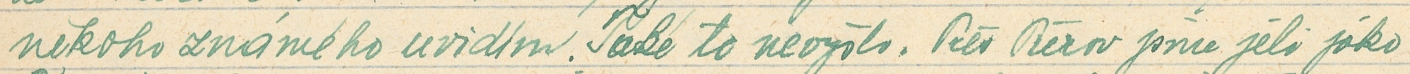někoho známého uvidím. Také to nevyšlo. Přes Přerov jsme jeli jako
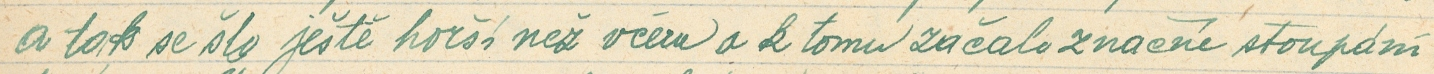a tak se šlo ještě horší než včera a k tomu začalo značné stoupání
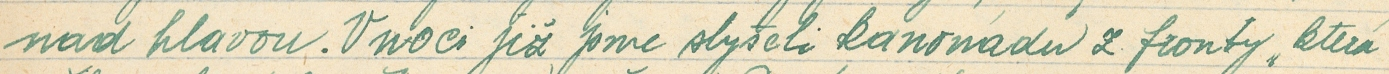nad hlavou. V noci již jsme slyšeli kanonádu z fronty, která
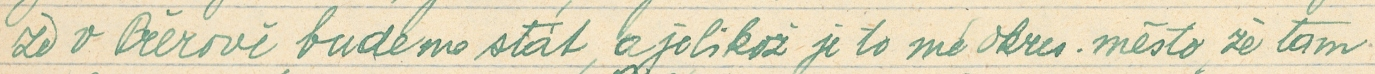že v Přerově budeme stát, a jelikož je to mé okres. město, že tam
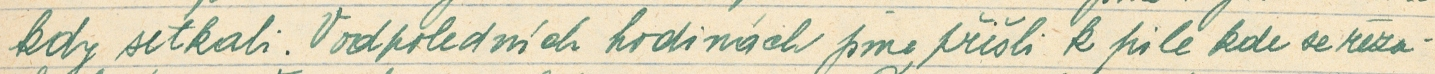kdy setkali. V odpoledních hodinách jsme přišli k pile kde se řeza-
